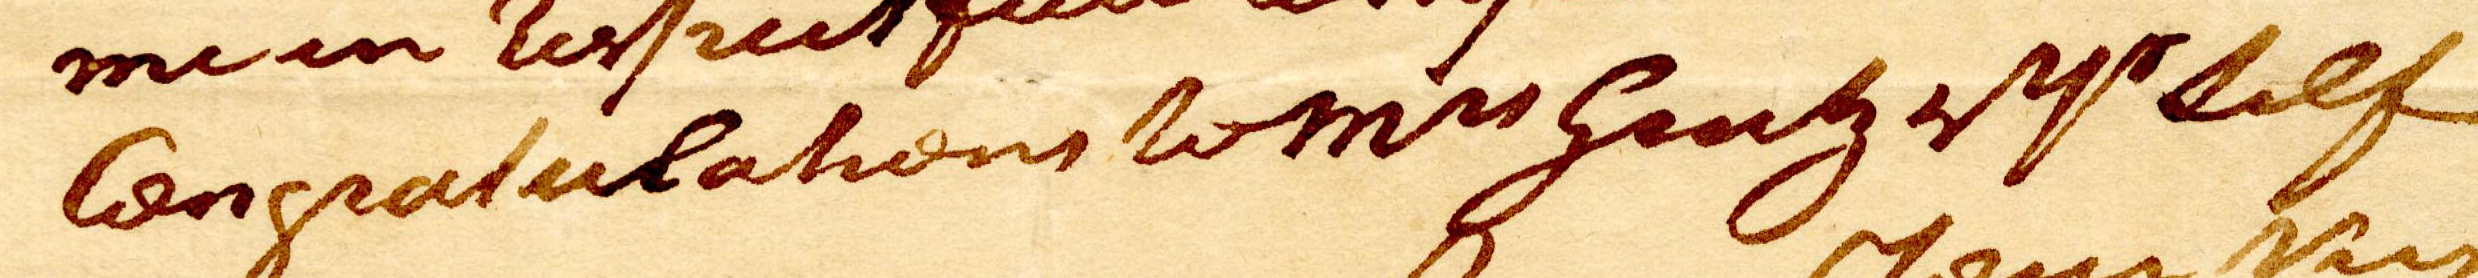Congratulations to M^rs Gratz & y^r self
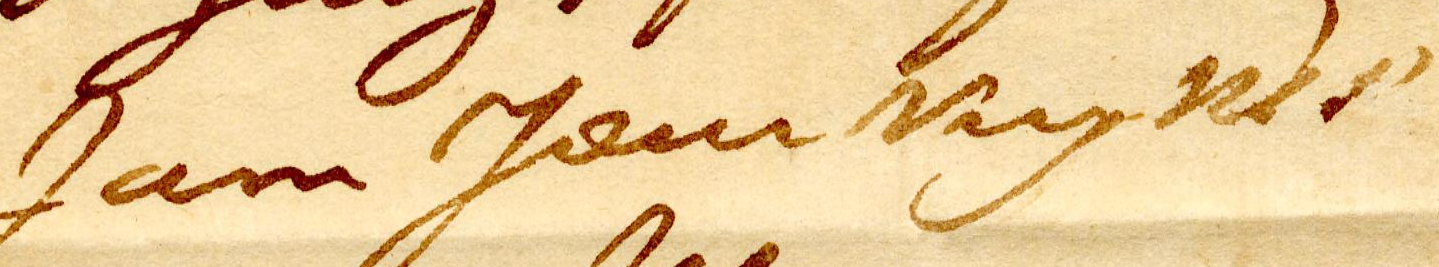I am your very Hbl
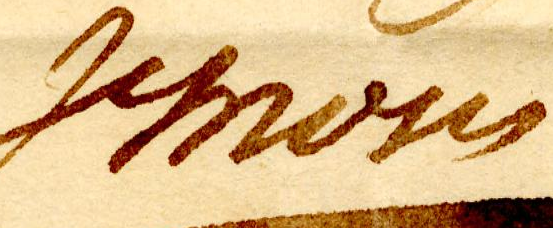I^c Moses
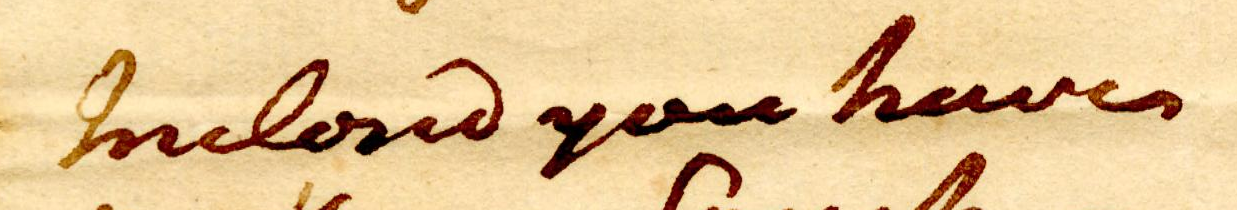inclosed you gave
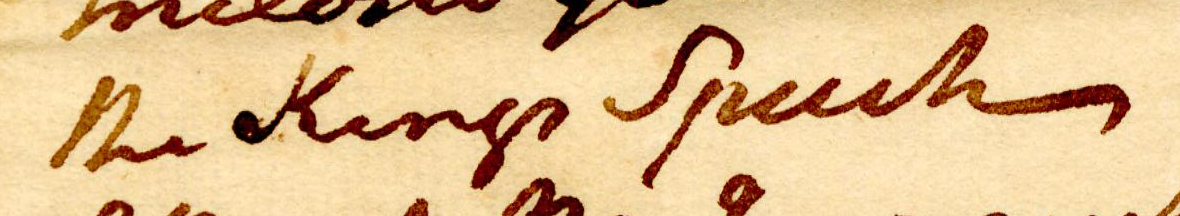the Kings Speech
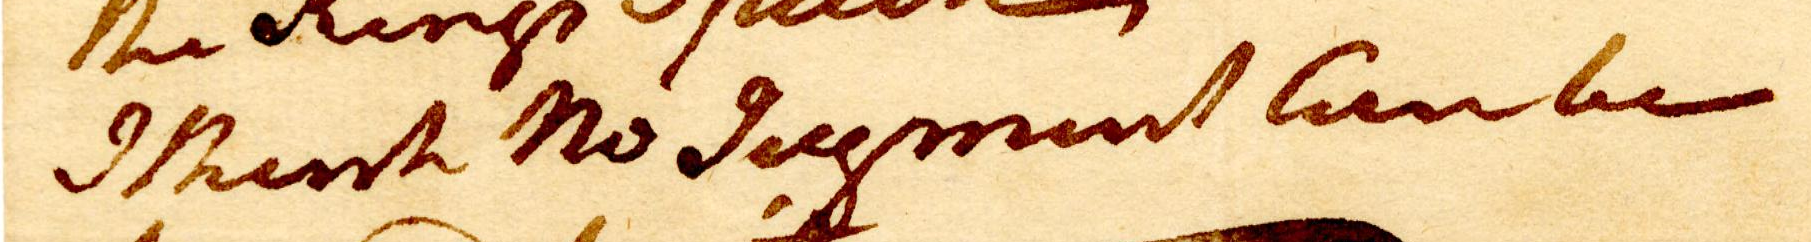I think no judgement can be
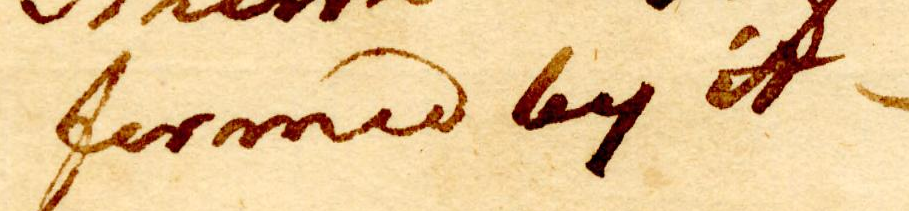formed by it-
